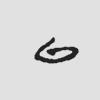㠯（以）
